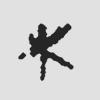木
